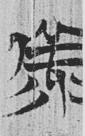備（服）
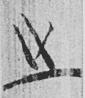之
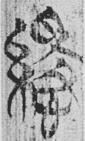○（緩）
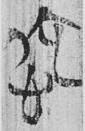○（弛）
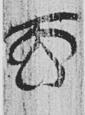而
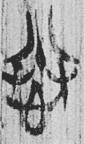○（惓）
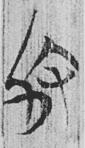○（力）
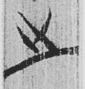之
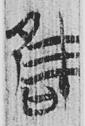唯（雖）
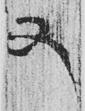又（有）
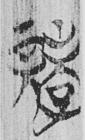○（孝）
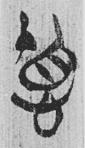惪（德）
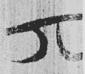亓（其）
